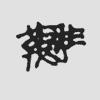難
